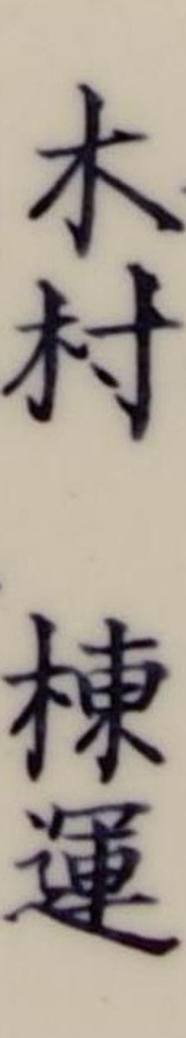木村棟運
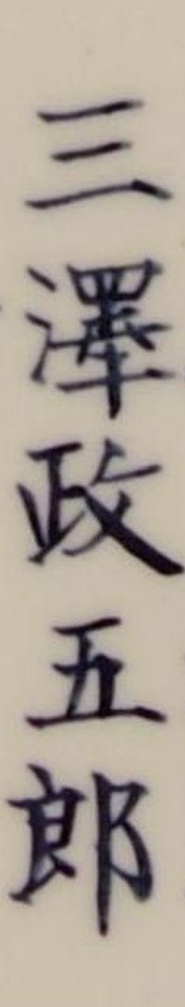三澤政五郎
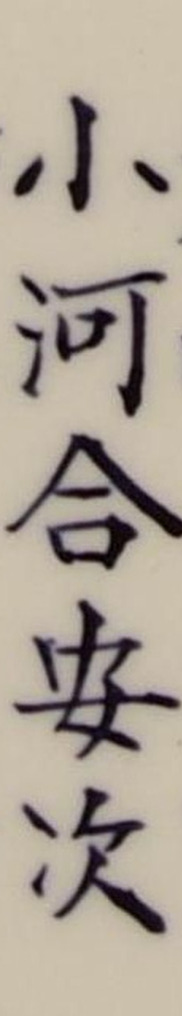小河合安次
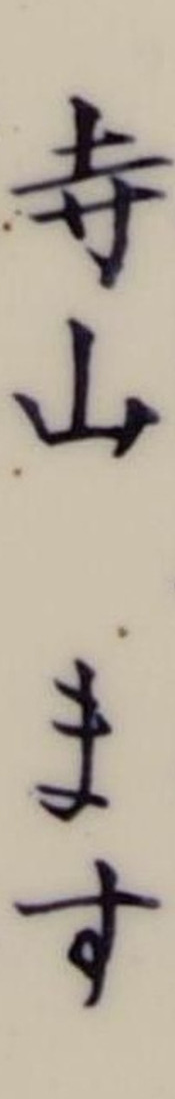寺山ます
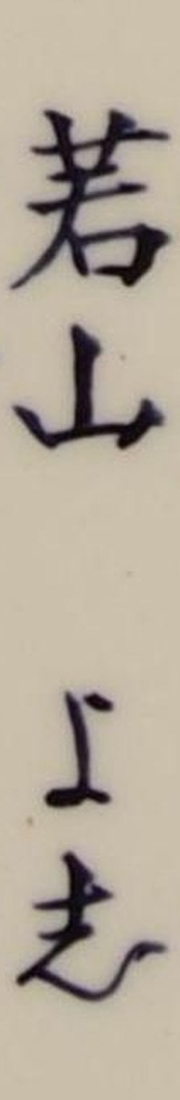若山よし
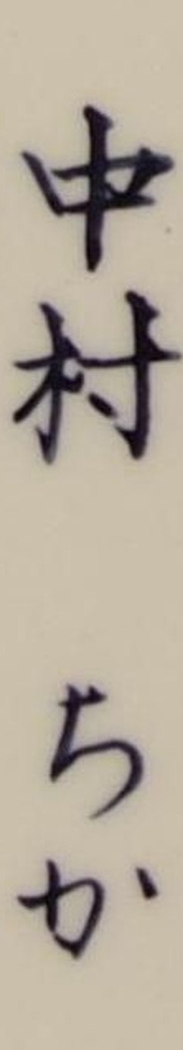中村ちか
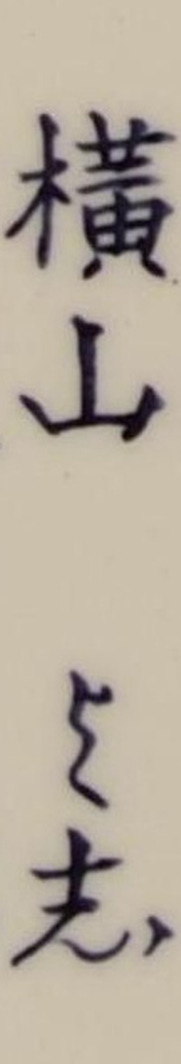横山よし
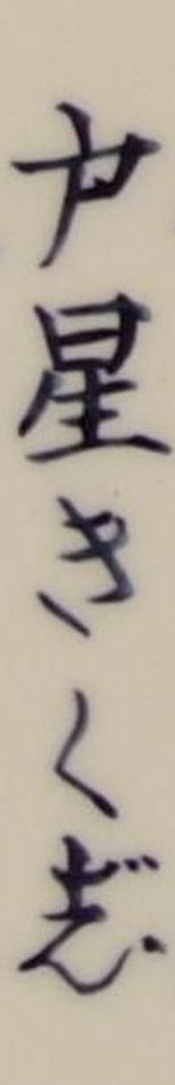戸屋きくじ
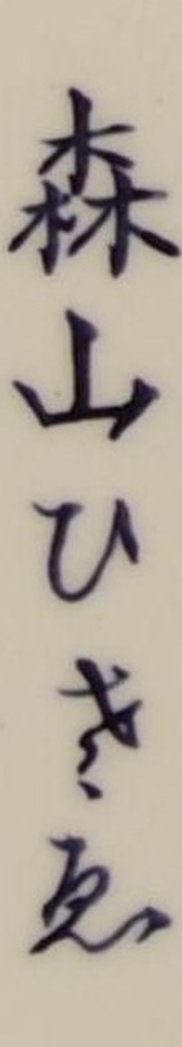森山ひさゑ
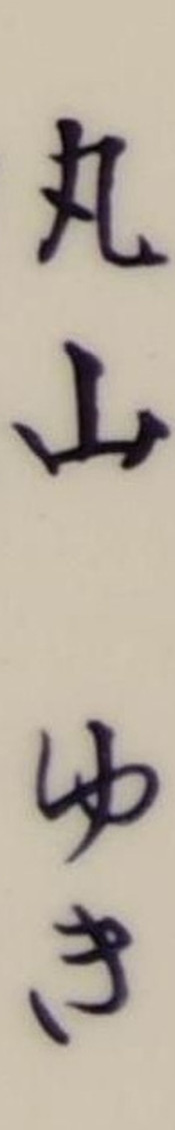丸山ゆき
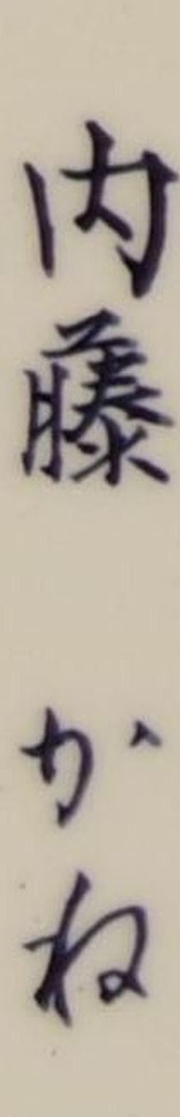内藤かね
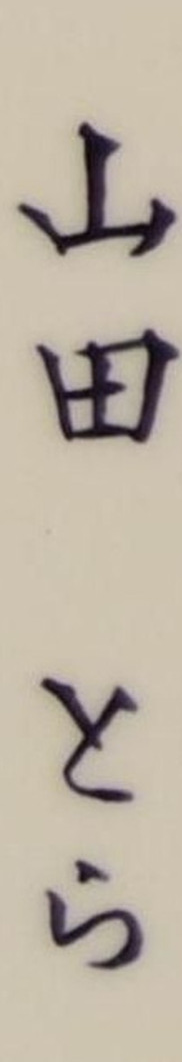山田とら

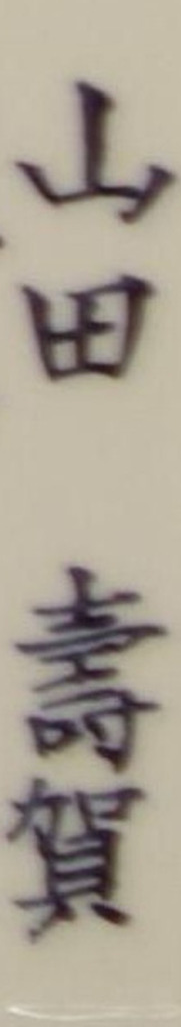山田壽賀
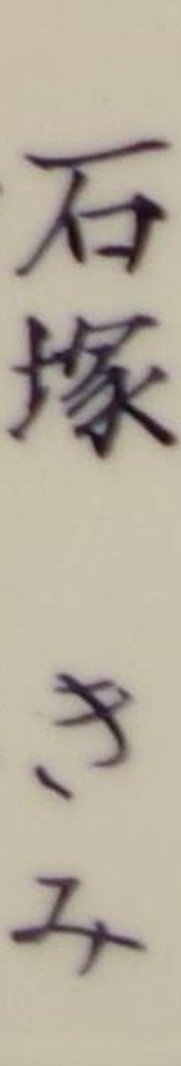石塚きみ
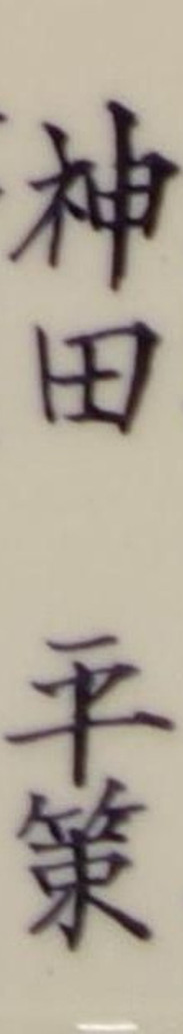神田平策
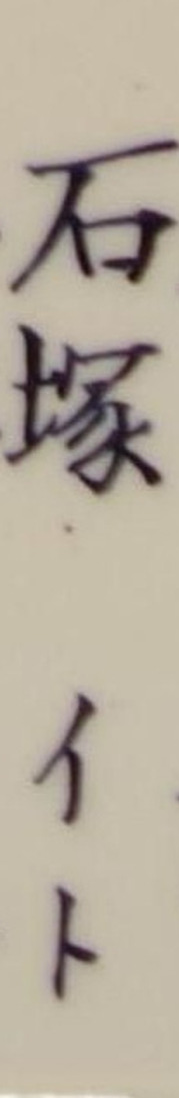石塚イト
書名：M~S
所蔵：高野山金剛峯寺
